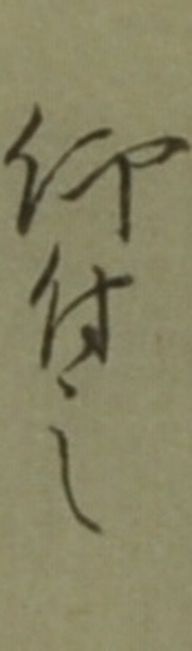仰付之
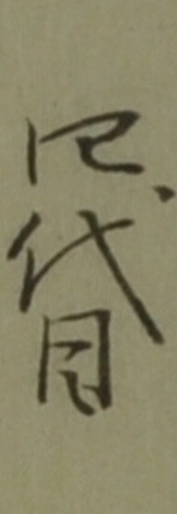四代目
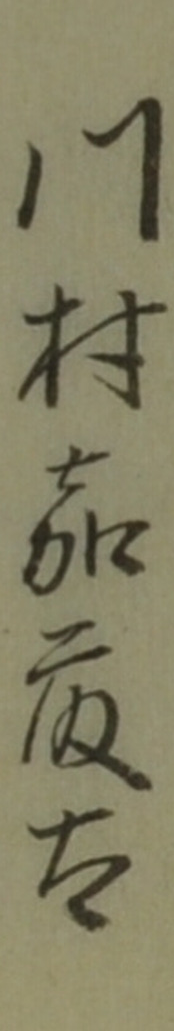川村嘉藤太
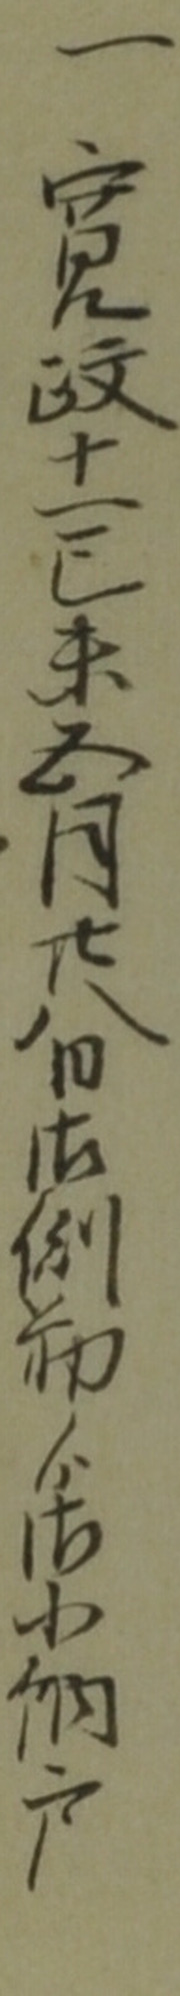一寛政十一己未五月廿八日御側勤ゟ御小納戸
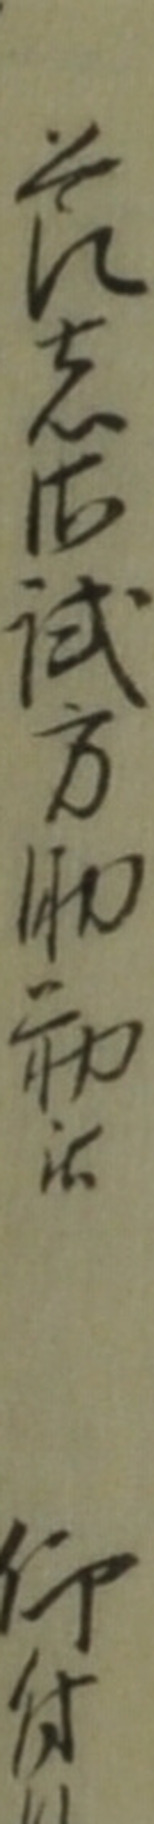節者御試方助勤被仰付候
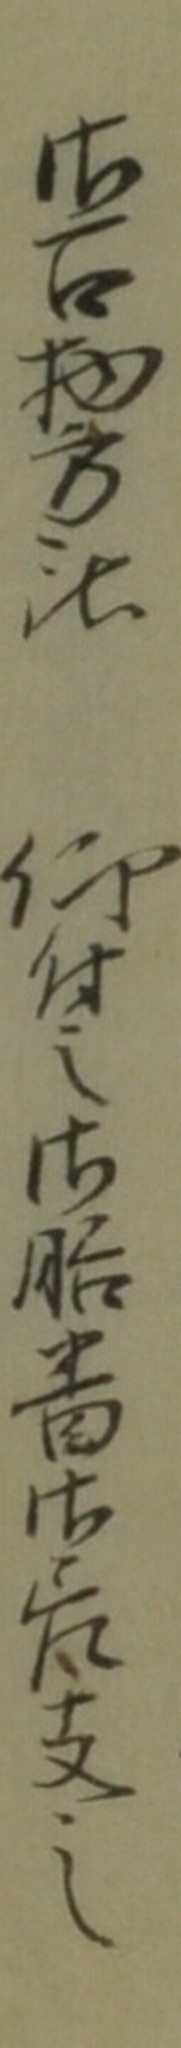御召物方被仰付之御膳番御差支之
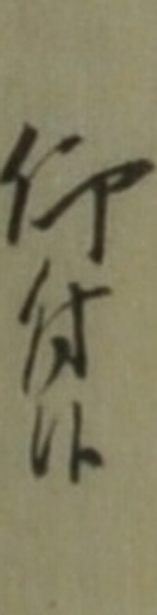仰付之
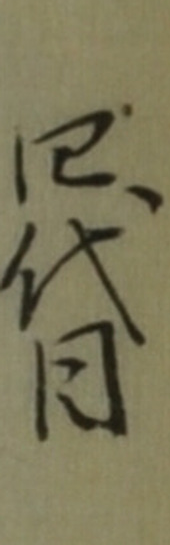四代目
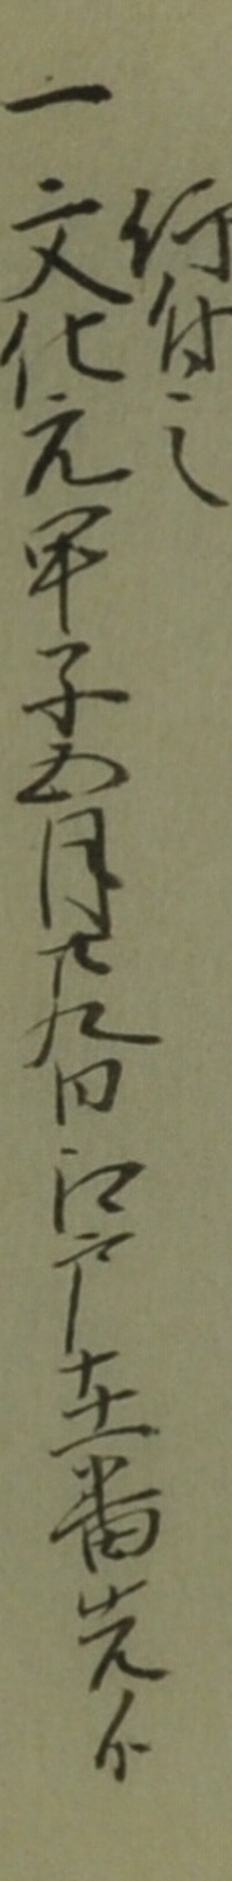一文化元甲子五月廿九日江戸在番先ゟ
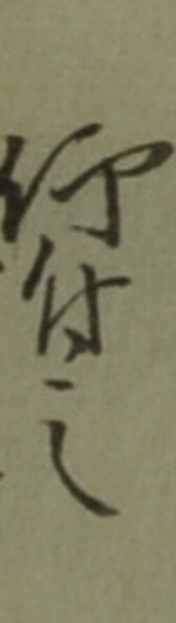仰付之
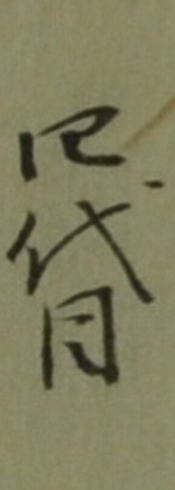四代目
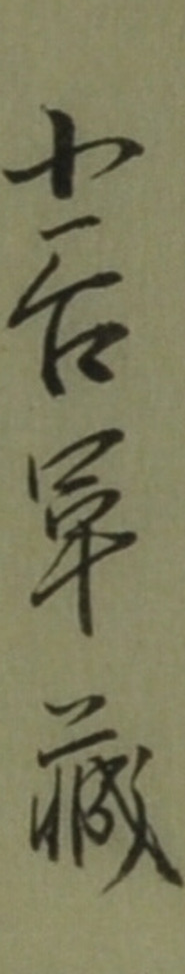小谷軍蔵
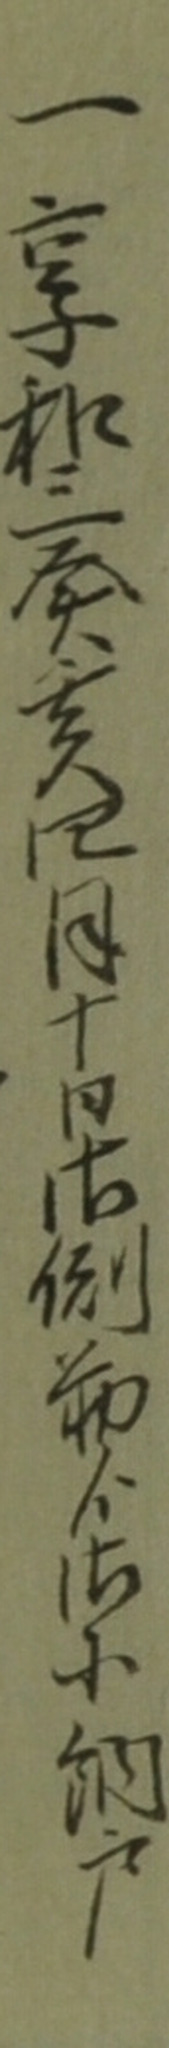一享和二癸亥四月十日御側勤ゟ御小納戸
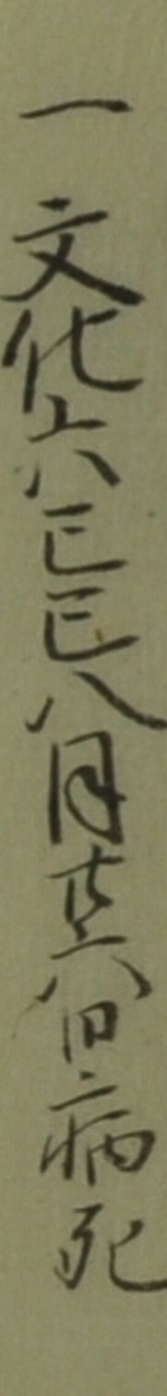一文化六己巳八月廿六日病死
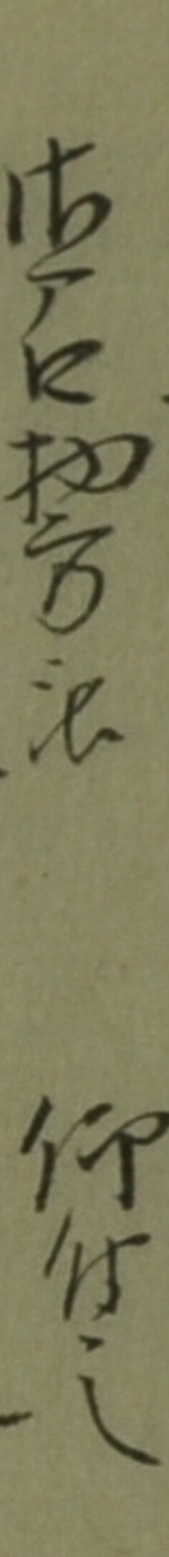御召物方被仰付之
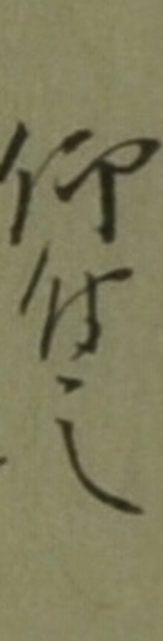仰付之
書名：諸御役代々録（四）
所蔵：伊那市立高遠町図書館・合同会社AMANE
